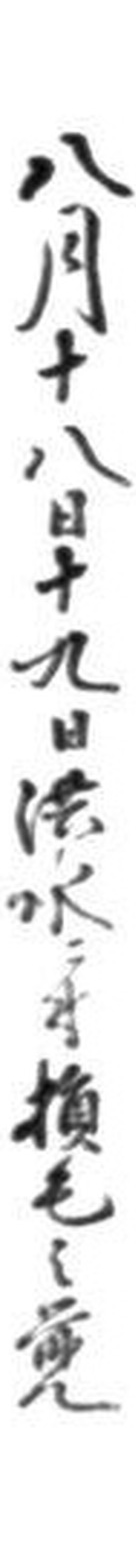八月十八日十九日洪水ニ付損毛之覚
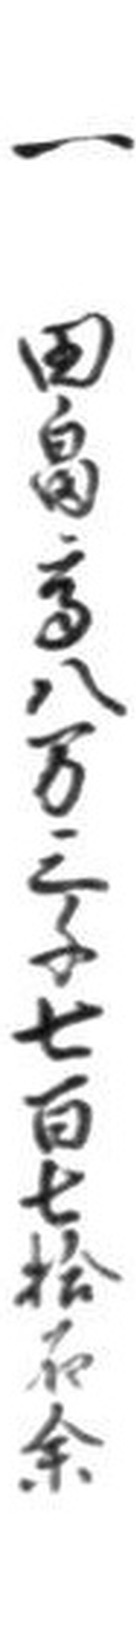一田畠高八万三千七百七拾石余
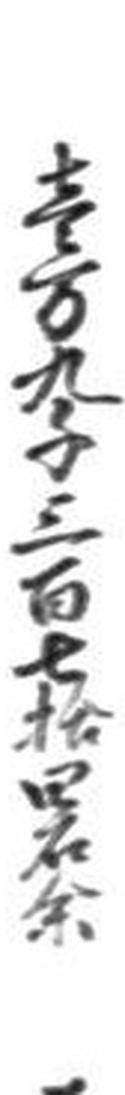壱万九千三百七拾四石余荒
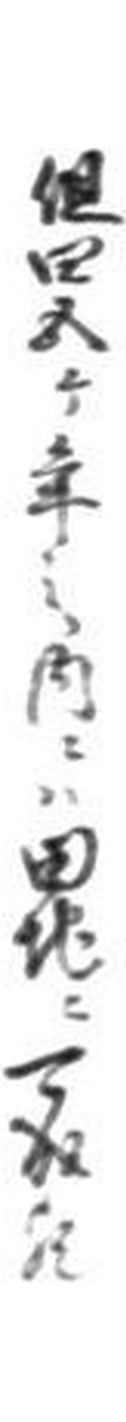但四五ケ年内ニハ田地ニ可成歟
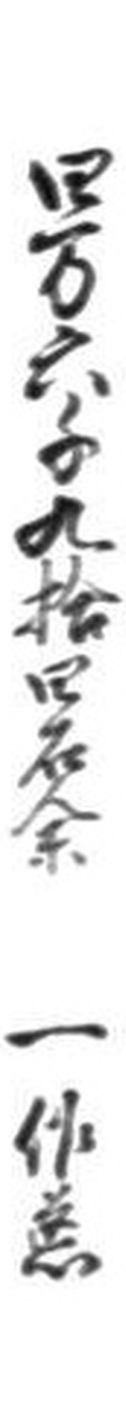四万六千九拾四石余一作荒
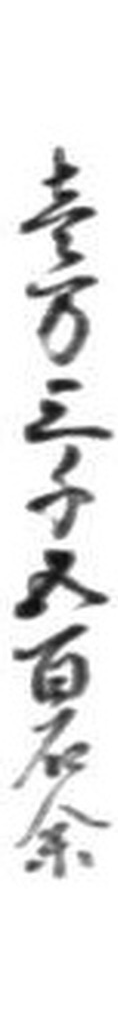壱万三千五百石余水押
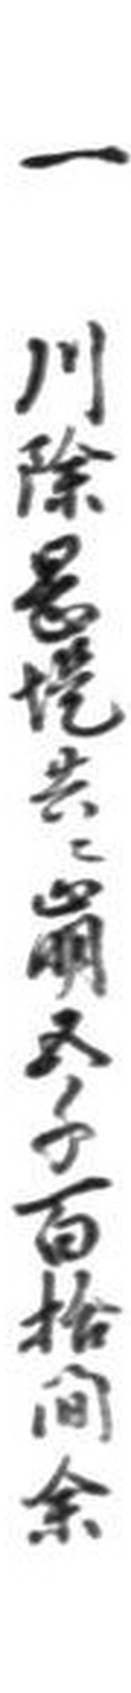一川除岡堤共ニ崩五千百拾間余

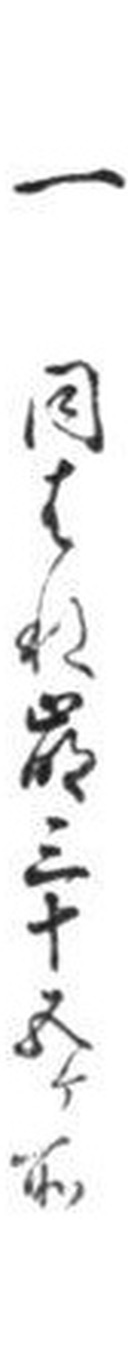一同はね崩三十五ケ所
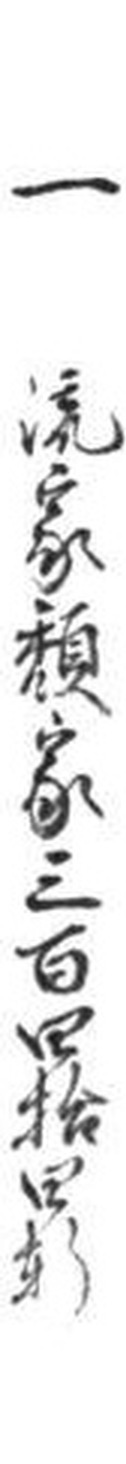一流家頽家三百四拾四軒
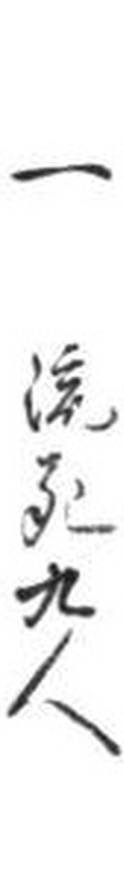一流死九人
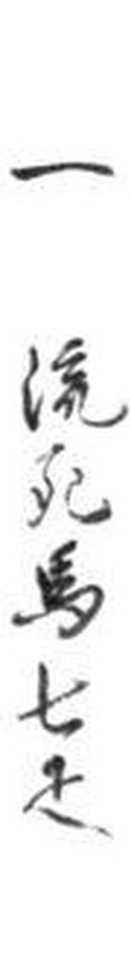一流死馬七疋
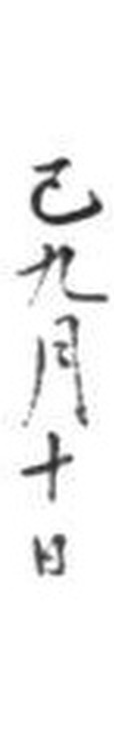巳九月十日
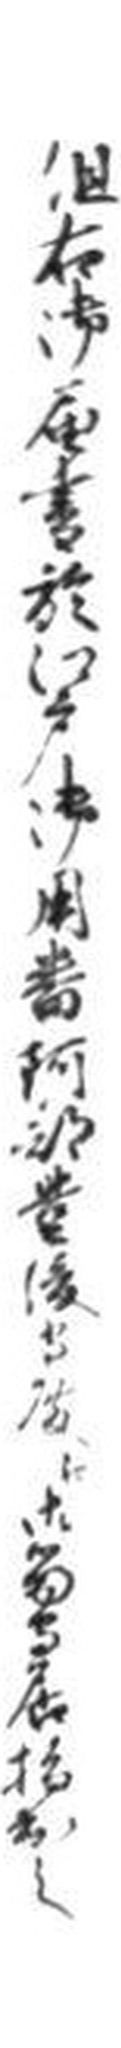但右御届書於江戸御用番阿部豊後守殿江御留守居指出之
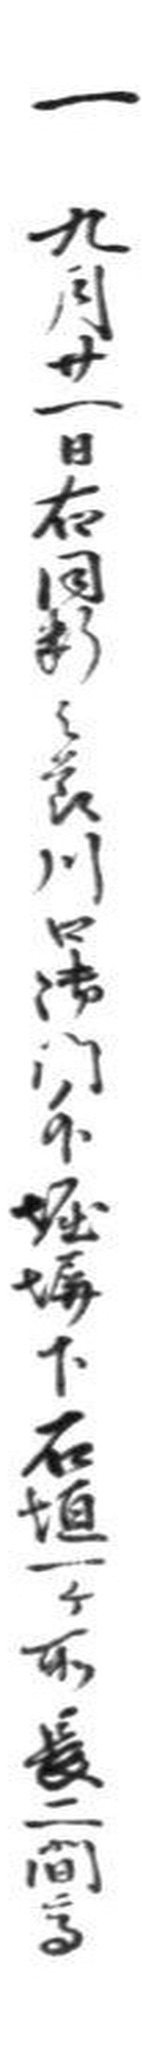一九月廿一日右同断之節川口御門外堀塀下石垣一ケ所長二間高
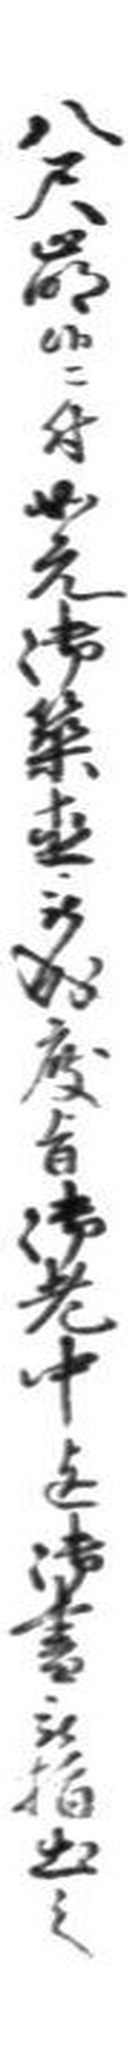八尺崩候ニ付如元築直被成度旨御老中迄御書被指出之
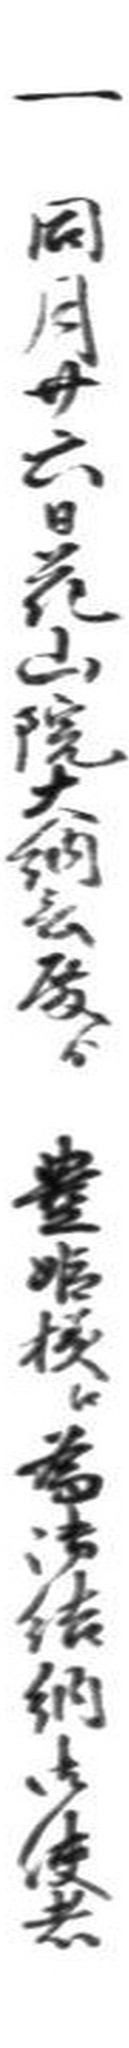一同月廿六日花山院大納言殿ゟ豊姫様江為御結納御使者
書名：家譜 二十一 吉品公 従元禄十三年到同十四年
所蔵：福井県文書館 Fukui Prefectural Archives
